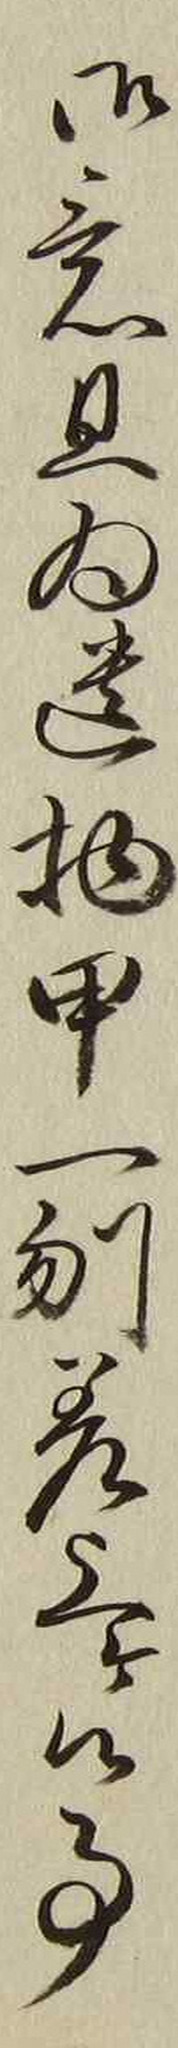御意且為遺物甲一刎差上ケ候事
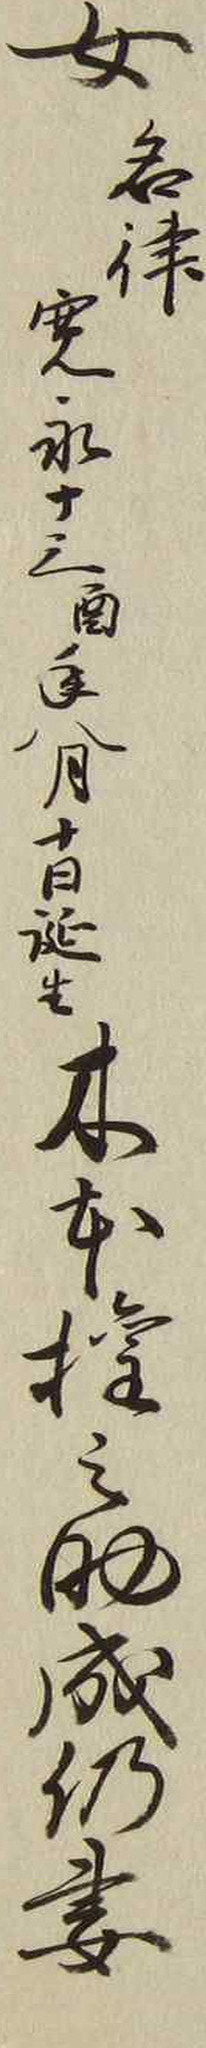女名律寛永十三酉年八月十日誕生木本権之助成仍妻

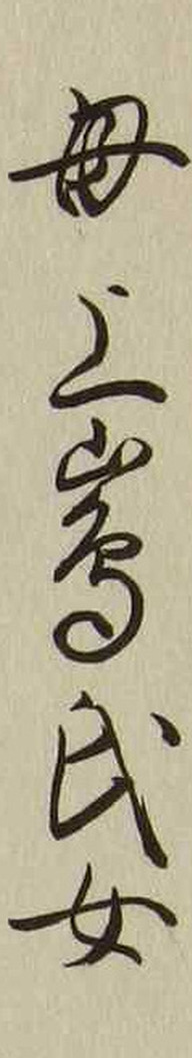母上嶋氏女
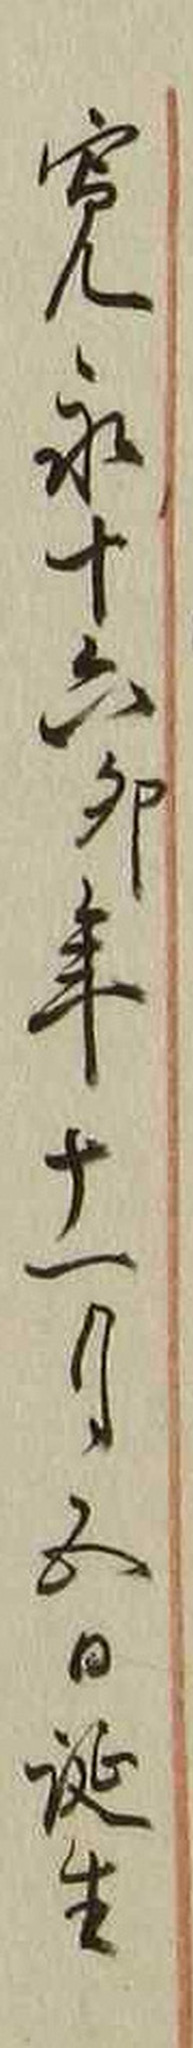寛永十六卯年十一月五日誕生
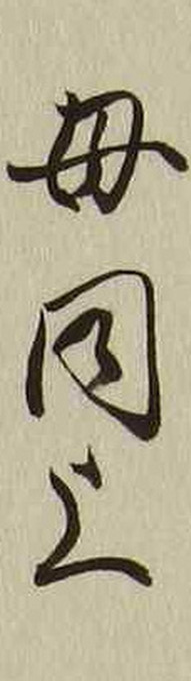母同上
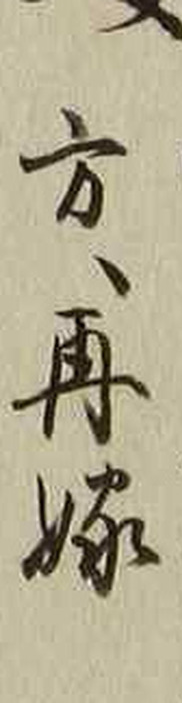方へ再嫁
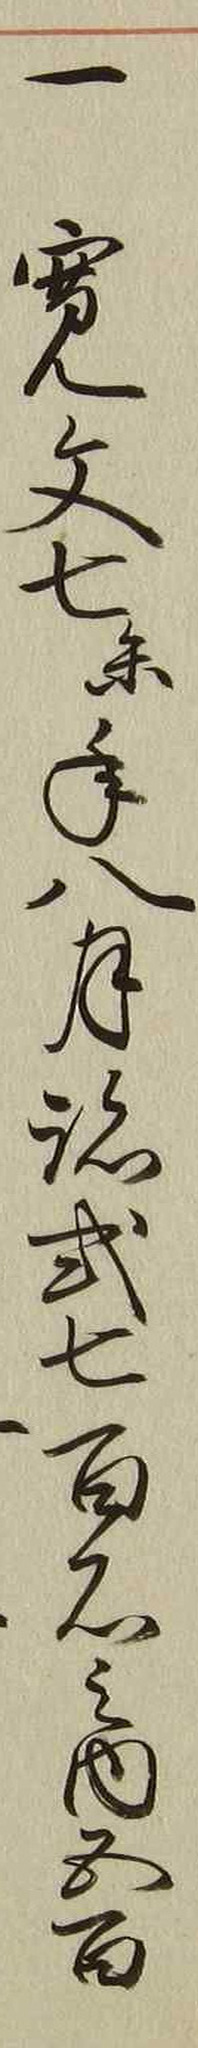一寛文七未年八月跡式七百石之内五百
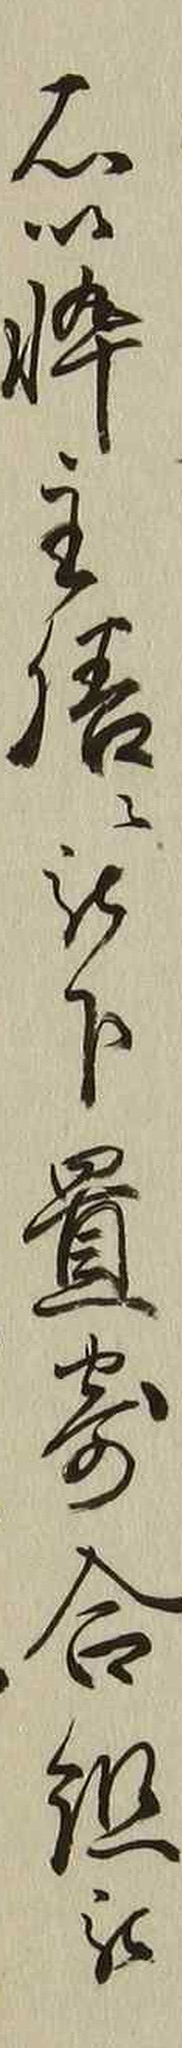石以忰主膳ニ被下置寄合組被
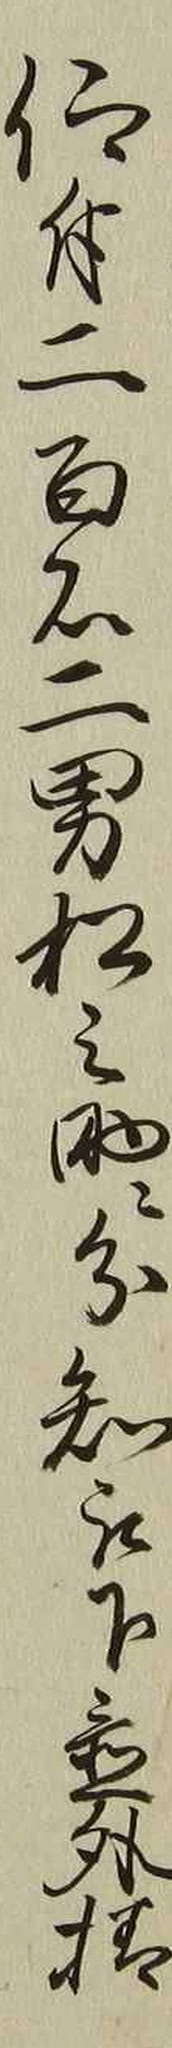仰付二百石二男松之助ニ分知被下置外様
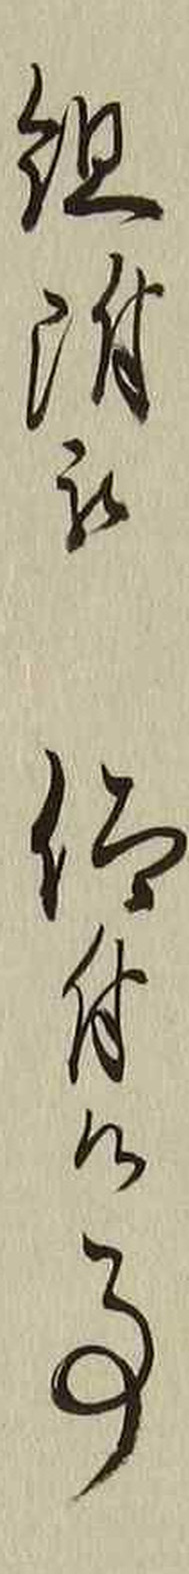組付被仰付候事
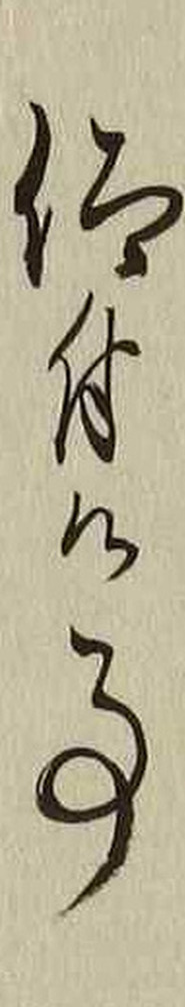仰付候事
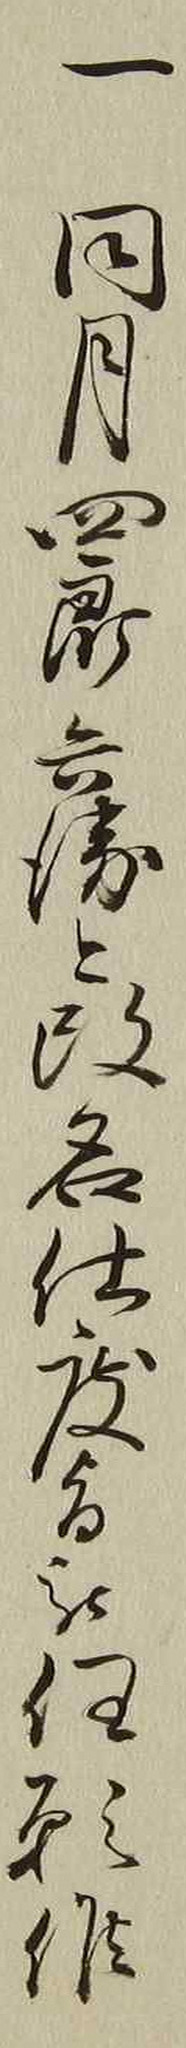一同月四郎兵衛と改名仕度旨被任願候
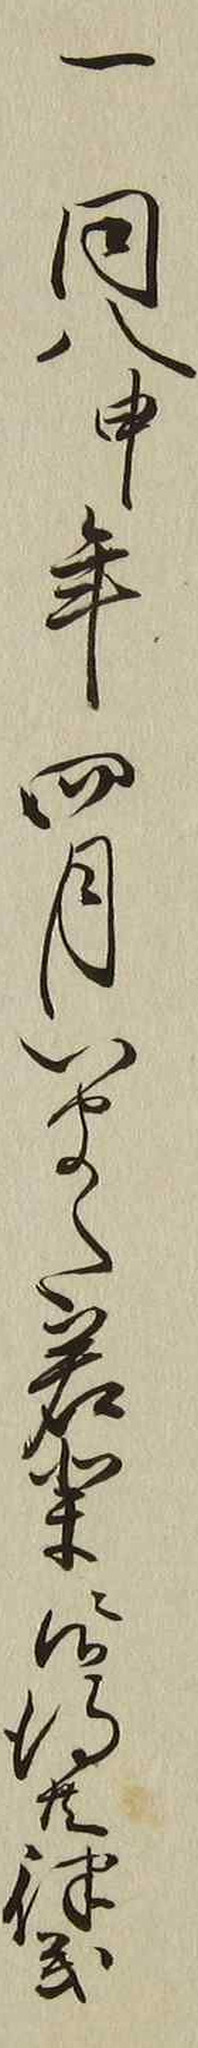一同八申年四月いまた若輩ニ候得共律義
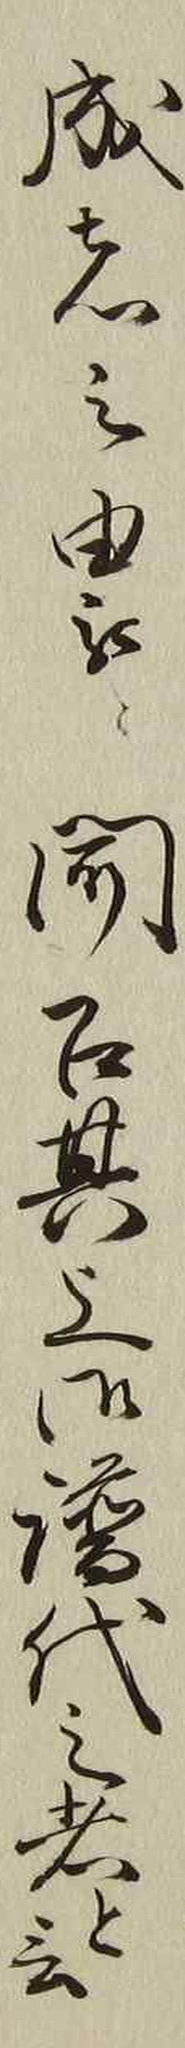成者之由被聞召其上御譜代之者と言
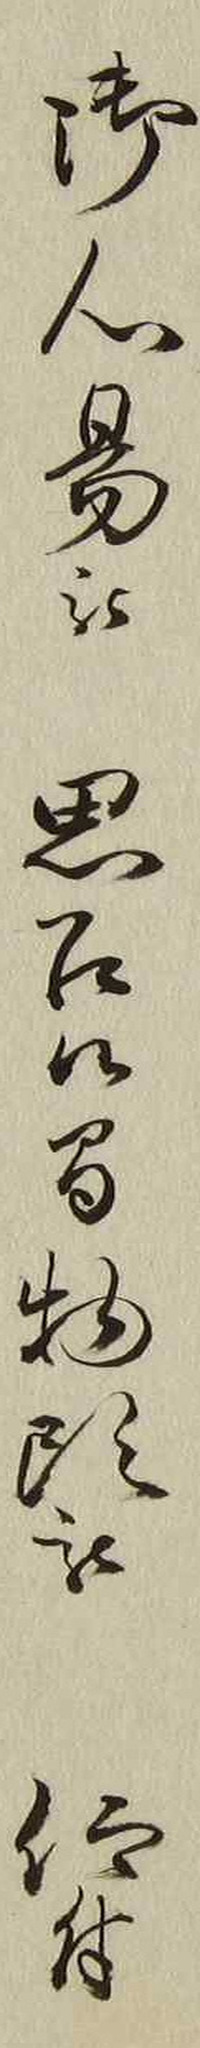御心易被思召候間物頭被仰付
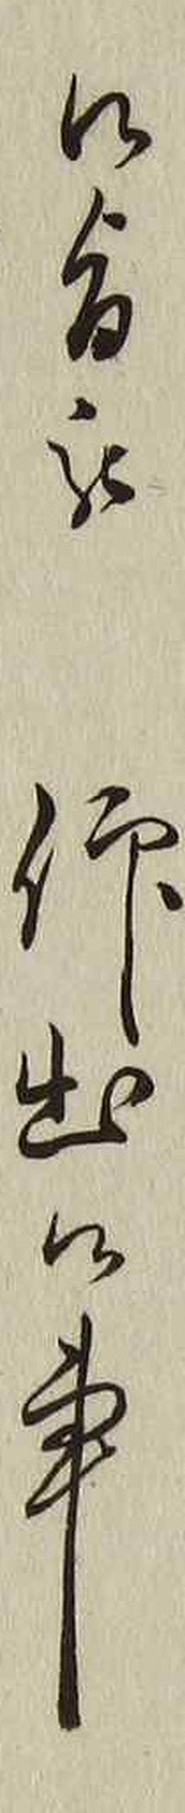候旨被仰出候事
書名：諸士系譜　巻之21　い之部21
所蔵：会津若松市立会津図書館
